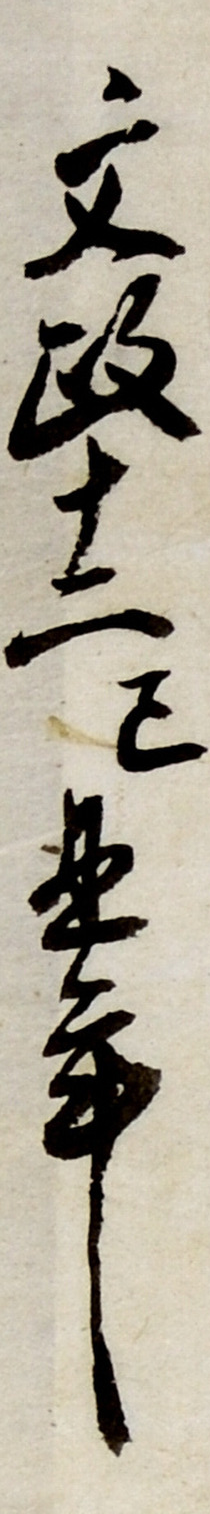文政十二己丑年
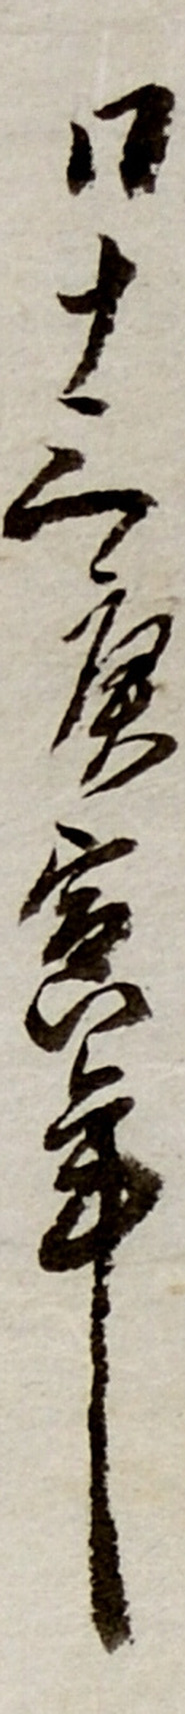同十三庚寅年
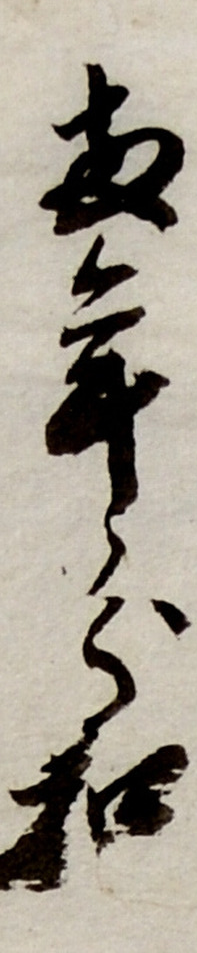両年分扣
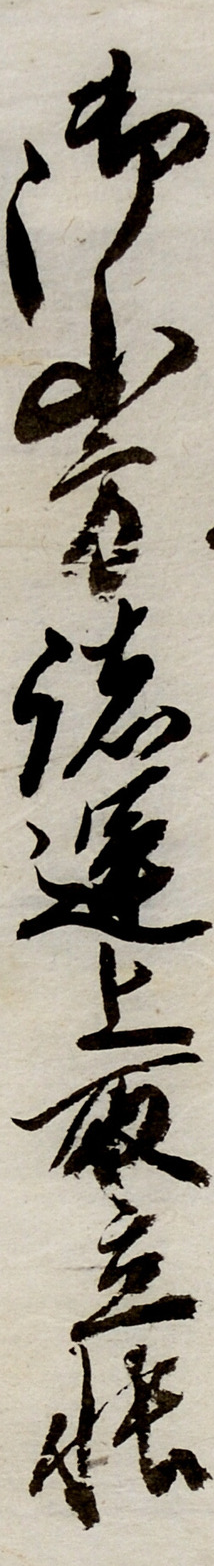御山方諸運上取立帳
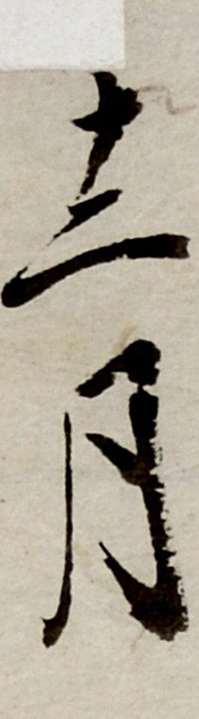十二月
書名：御山方諸運上取立帳
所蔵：伊那市立高遠町図書館・合同会社AMANE
